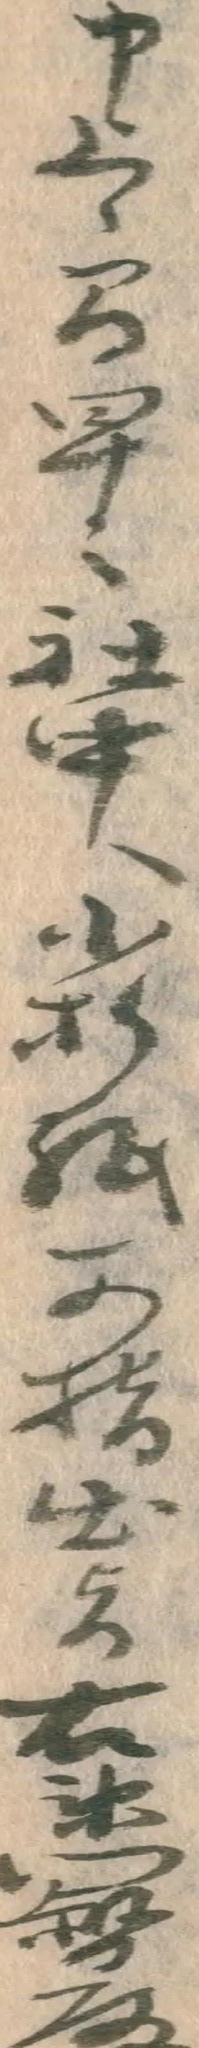申上候間、早々社中へ小折紙可指出旨、右衛門督殿
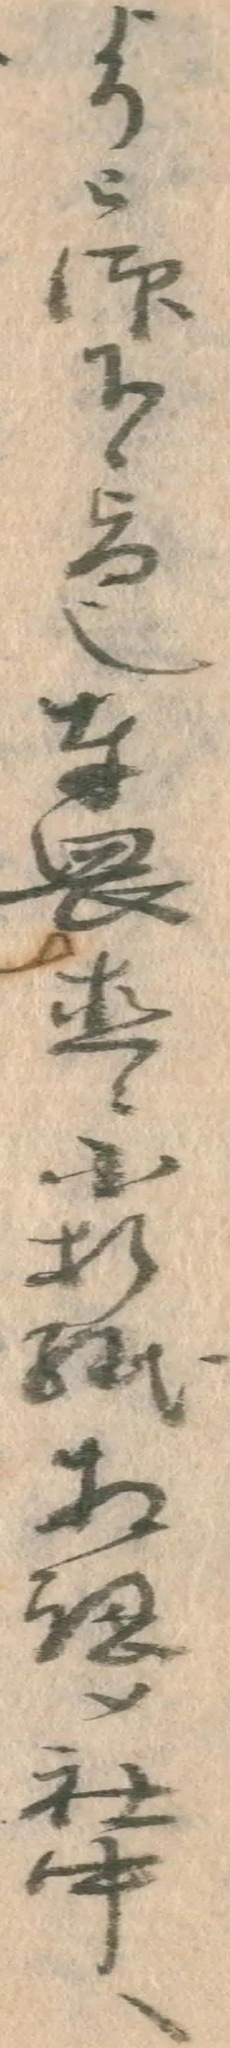より被仰下候旨也、奉畏直々小折紙相認メ、社中ヘ
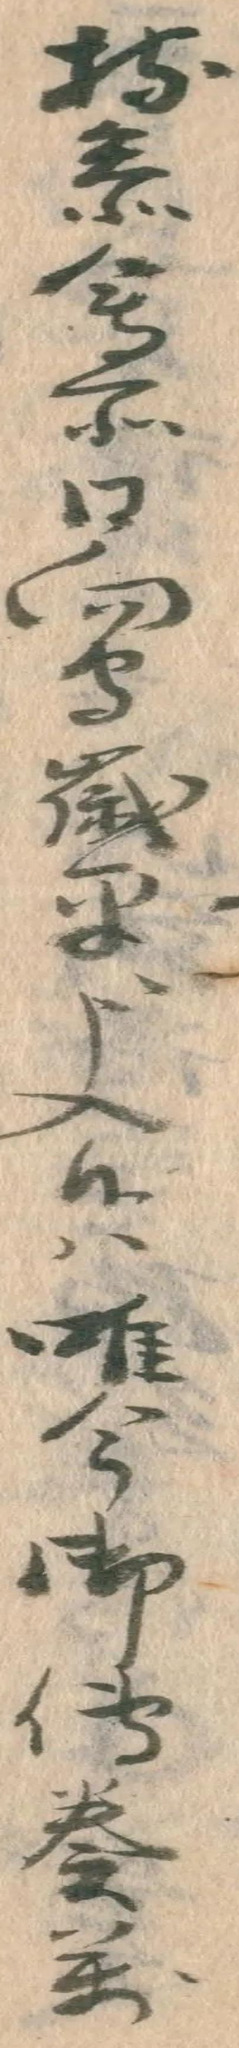持参、會所日向守歳平へ申入候ハ、唯今御伝奏萬
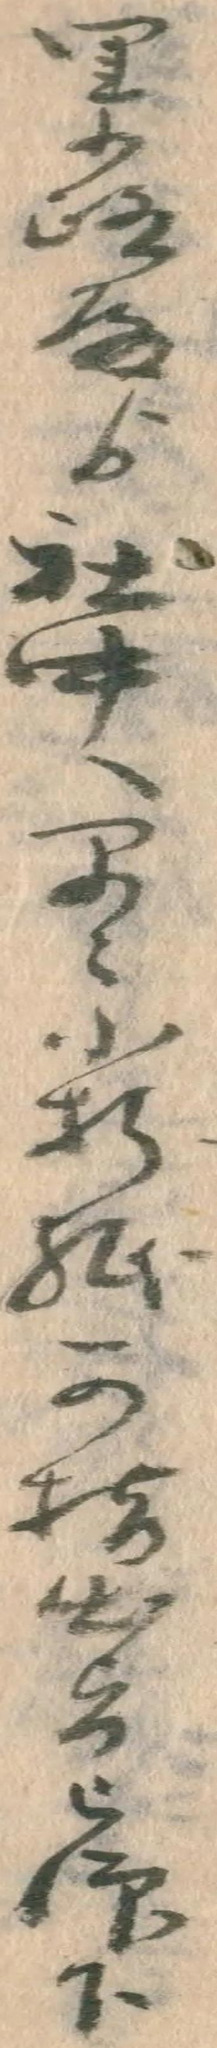里小路殿ゟ社中へ早々小折紙可指出旨被仰下
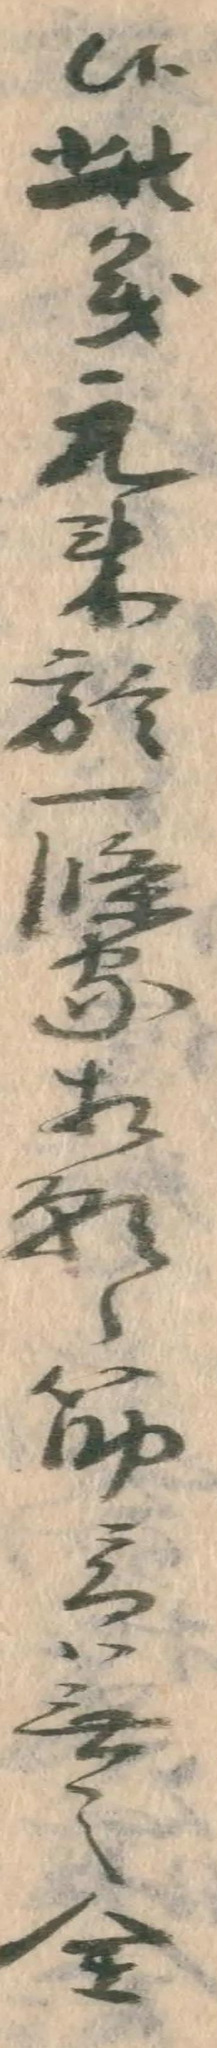候、此義元来於一條家相願候筋ニ而ハ無之、全
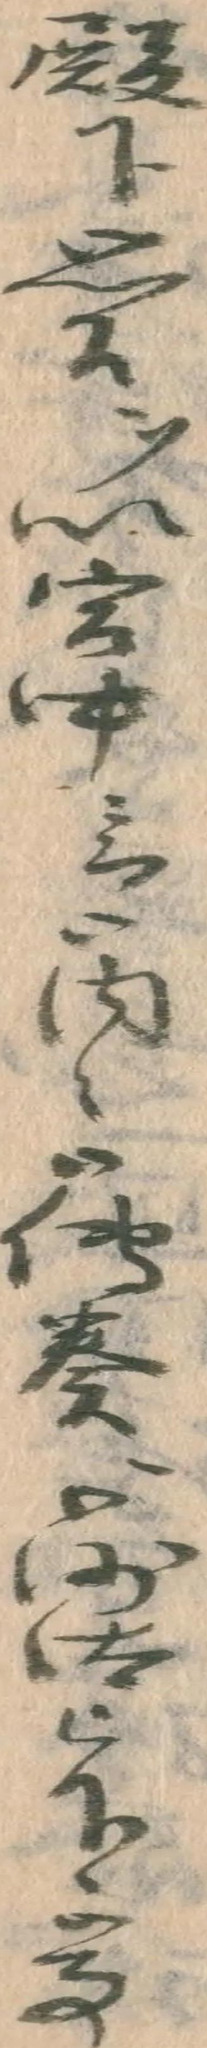殿下思召ヲ以宮中ニ而御内之御伝奏ヘ御沙汰被下候事
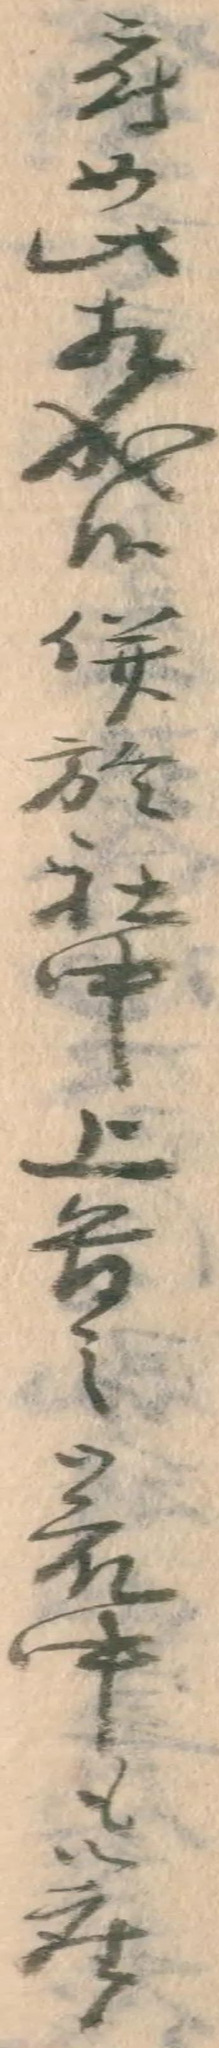ニ付、如此相成候、併於社中上首之御衆中も御座候
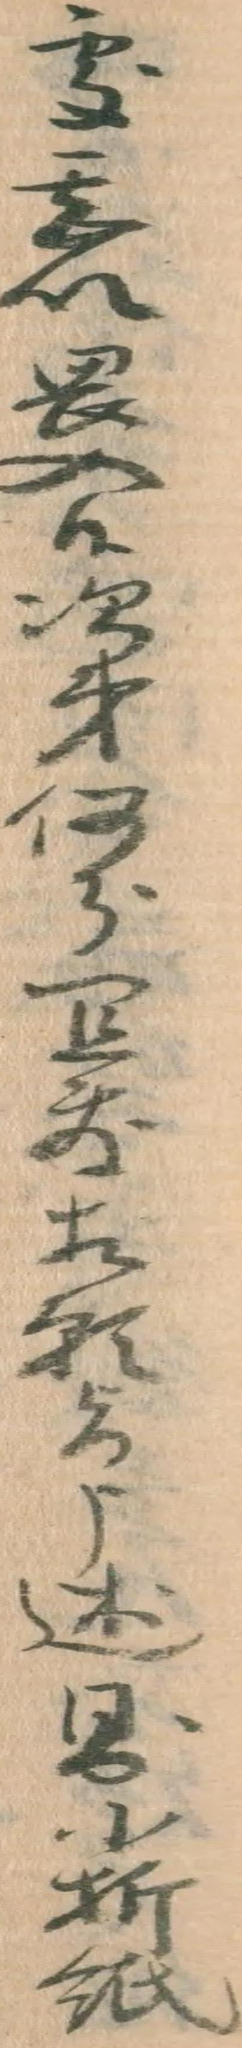處、甚以畏入候次第、何分宜敷相願旨申述、則小折紙
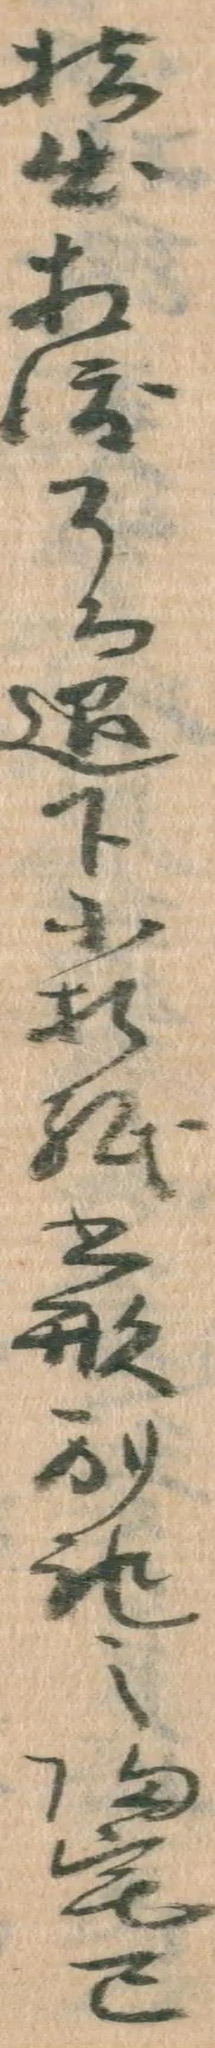指出相渡了而退下、小折紙書形別記也、帰宅已
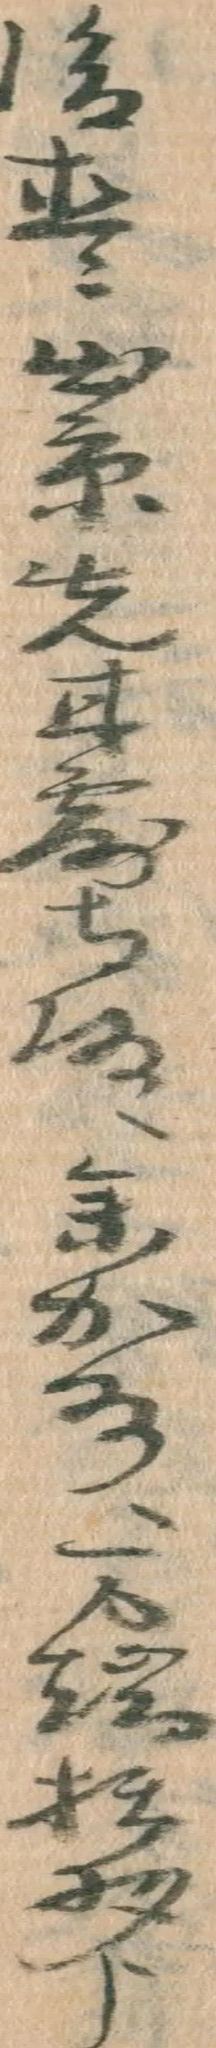後、直に出京、先甘露寺殿へ参、加州へ方端相双申
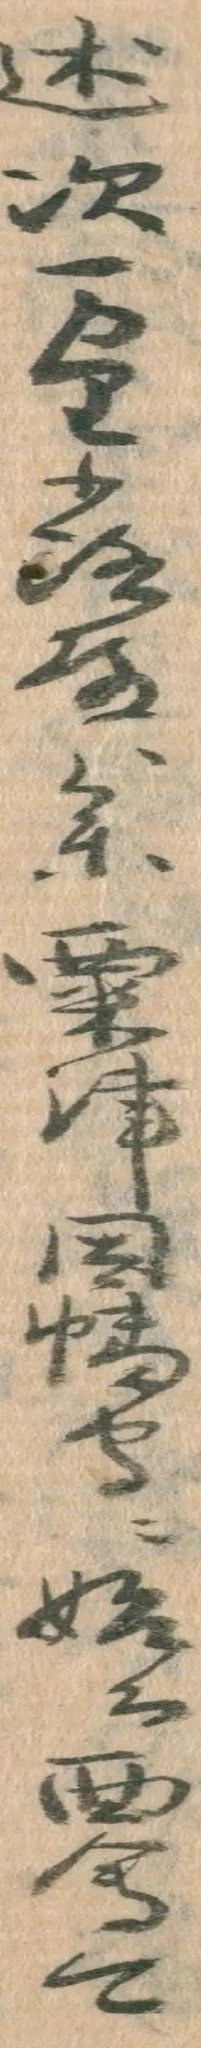述、次万里小路殿へ参、粟津因幡守に始而面會可
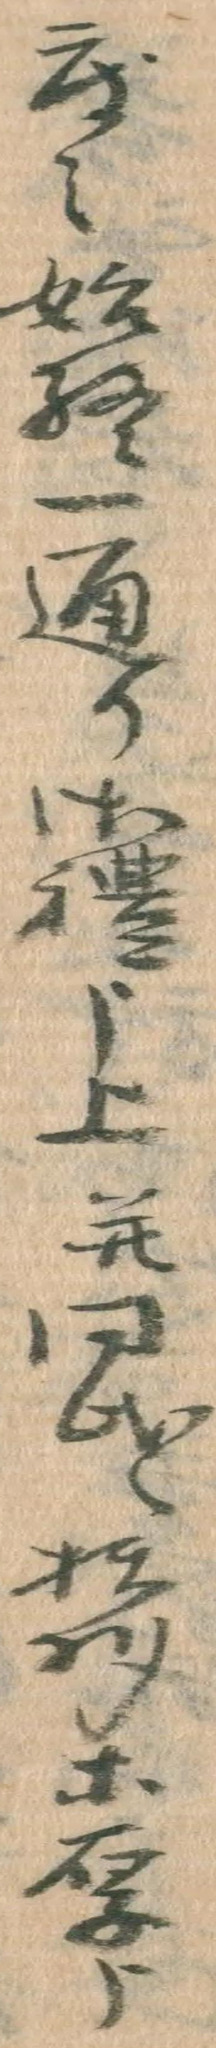度之、始終一通り御礼申上、并同氏へ挨拶等厚申
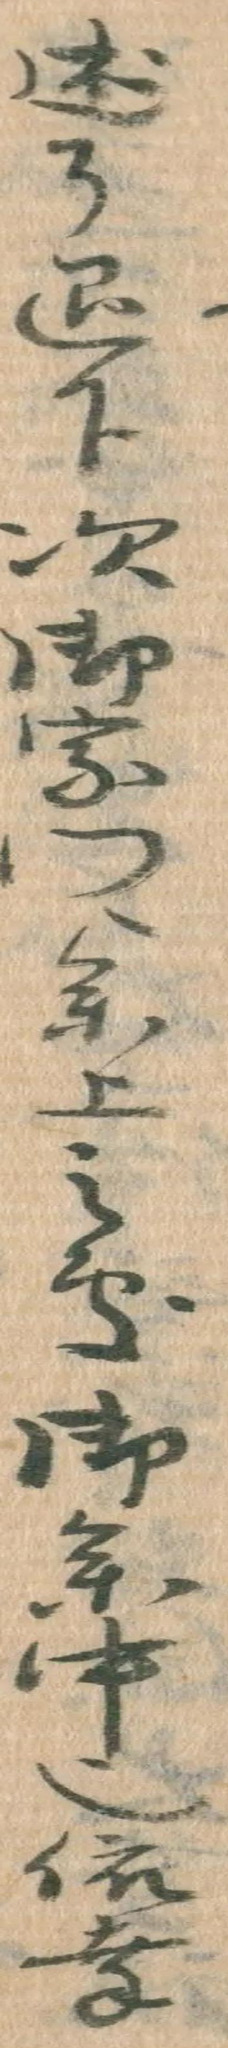述了退下、次御家門へ参上之處、御参中也、依幸
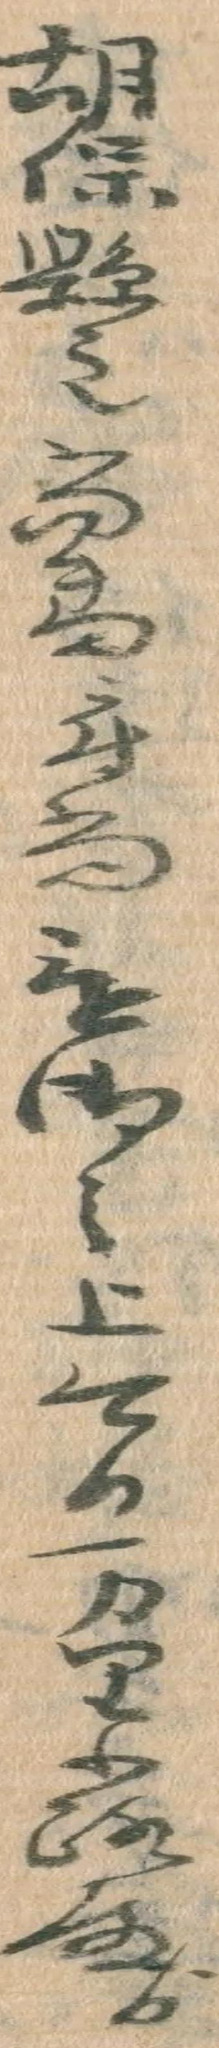胡保縣主當番ニ付、當座御之上、今日万里小路殿ゟ
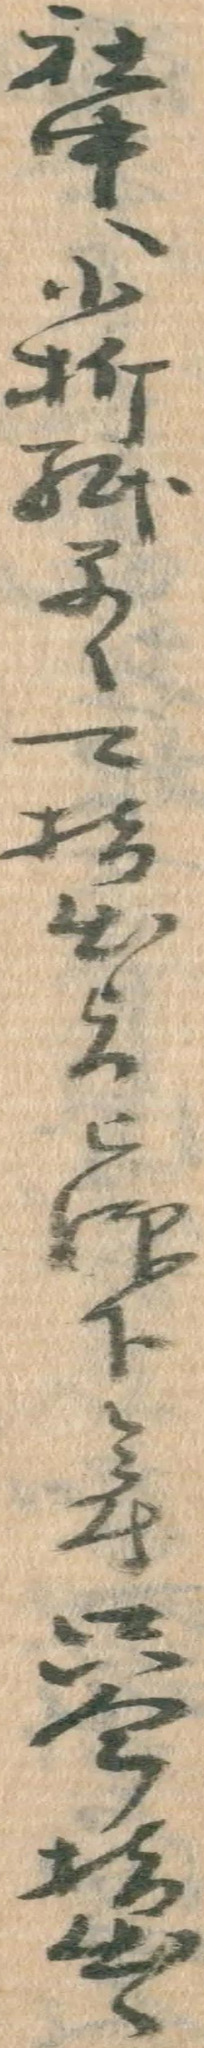社中へ小折紙早々可指出旨被仰下候ニ付、只今指出候
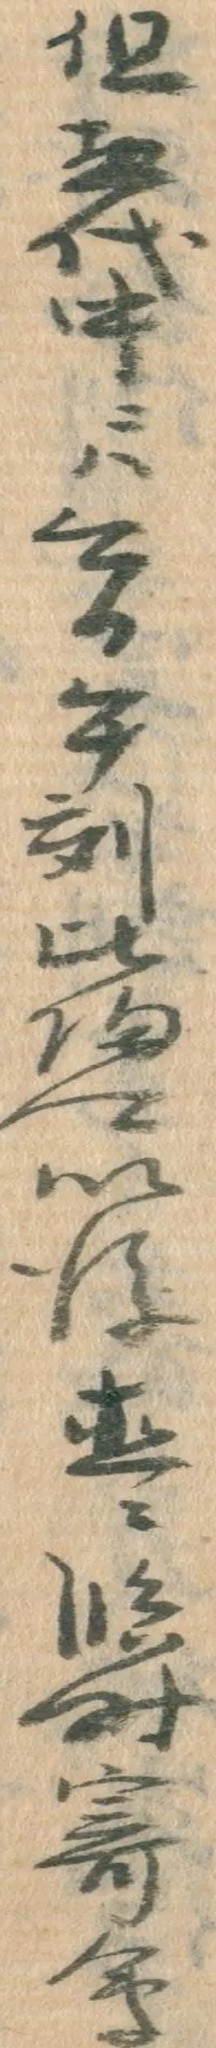但惣代中ニハ、今日午刻比帰郷以後、直ニ臨時寄會
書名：賀茂社記録. 第63冊
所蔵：国立国会図書館 National Diet Library, JAPAN
